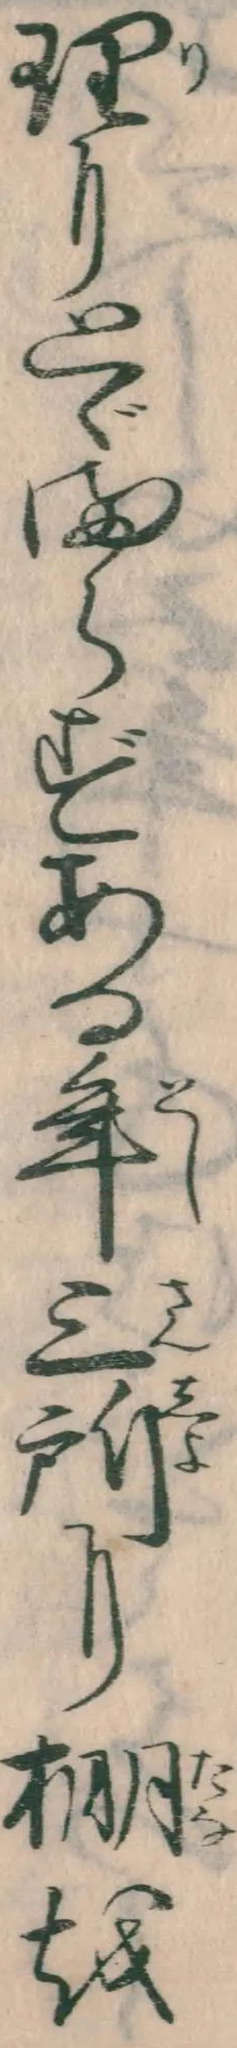理にとゞまらずある年三所に棚を
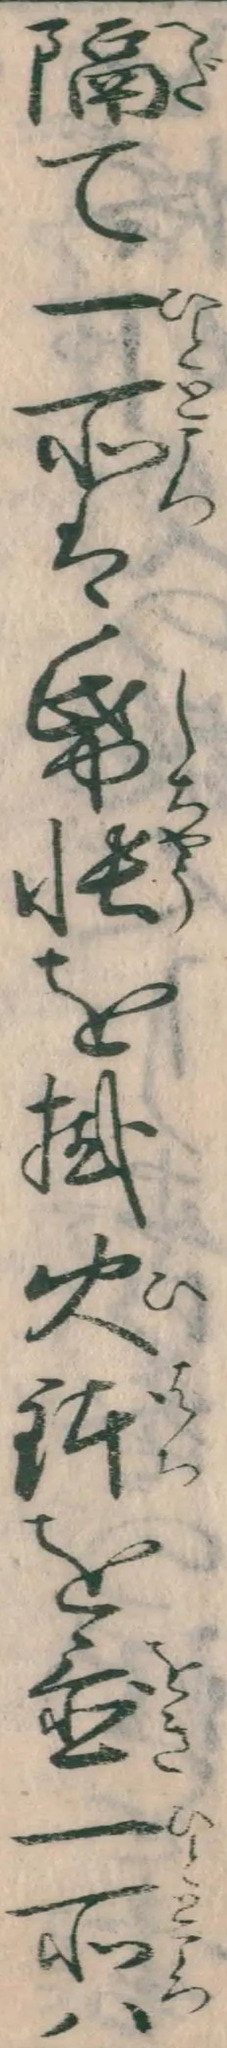隔て一所は紙帳を掛火鉢を置一所は
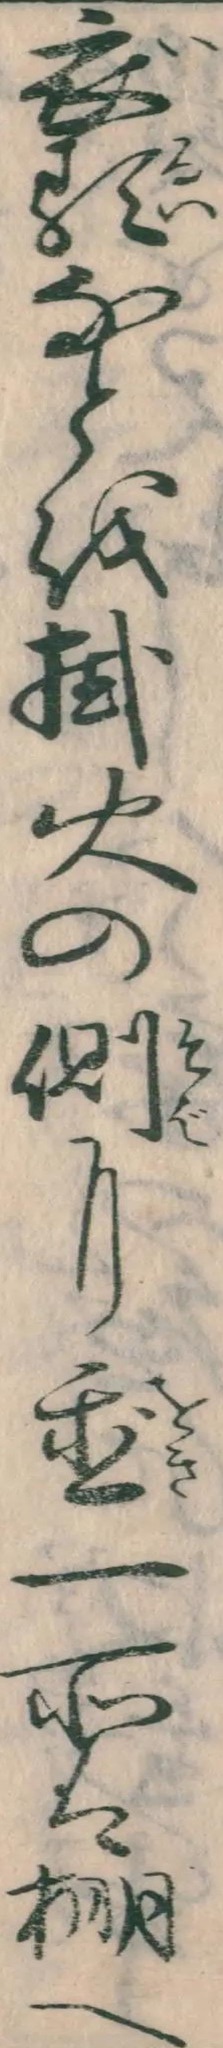衣類なとを掛火の側に置一所は棚へ
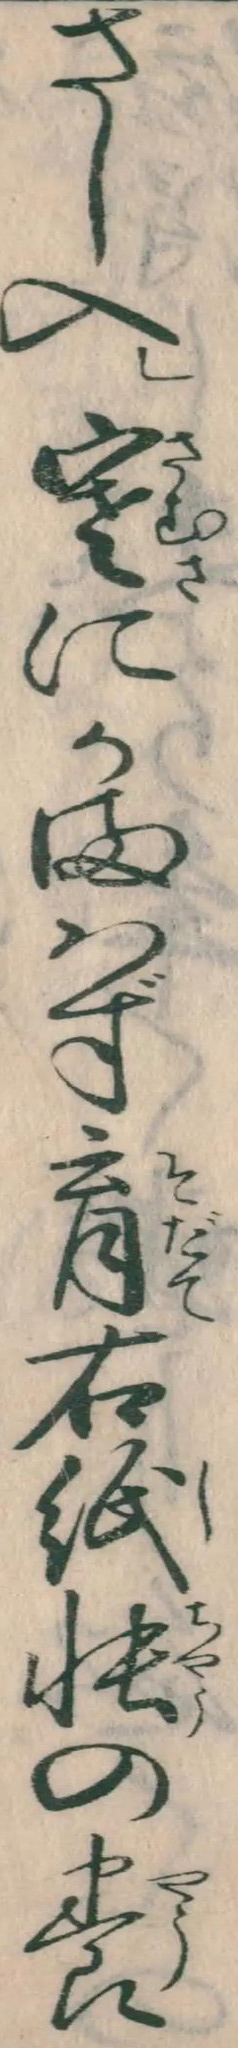さし入れ寒にかまはず育右紙帳の養

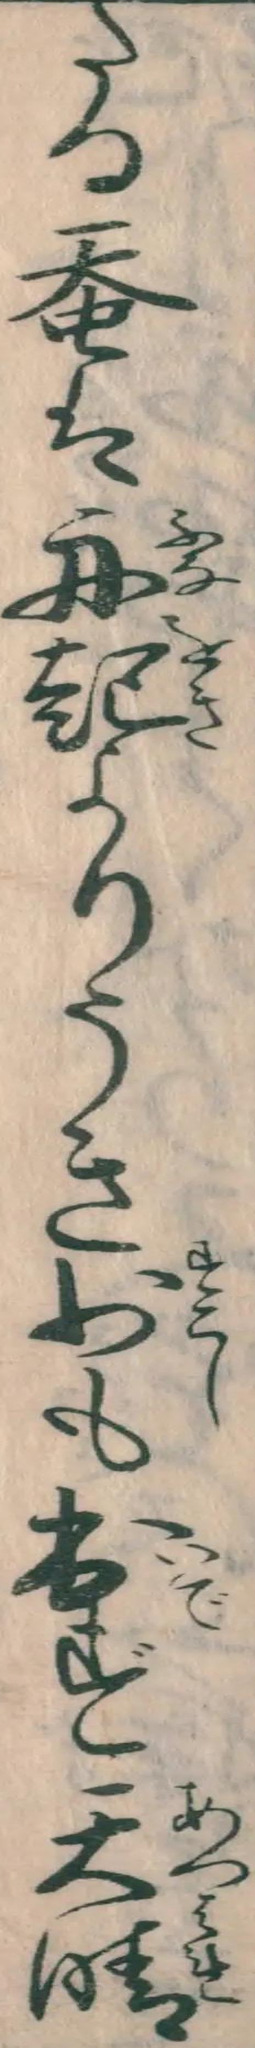たる蚕は舟起よりうき少も出ず天晴
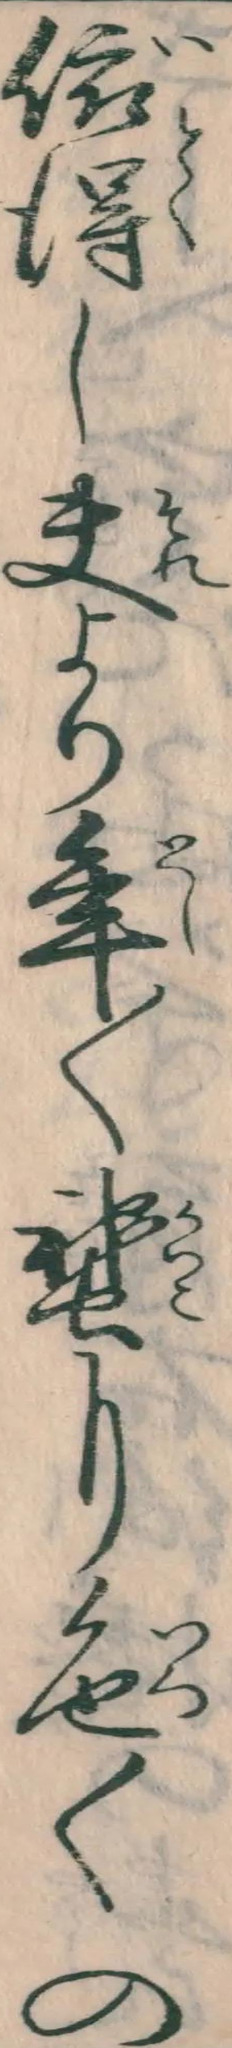依得し夫より年〳〵䗝に色〳〵の
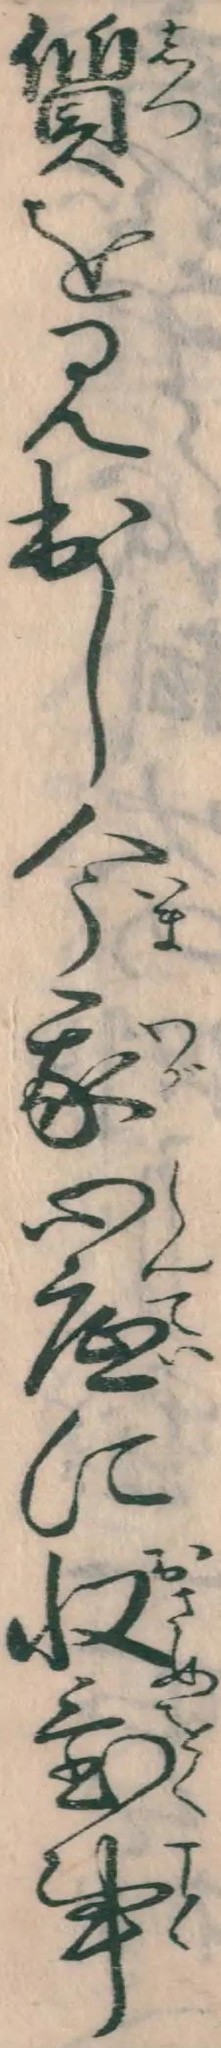質を見出し今我心底に収置事
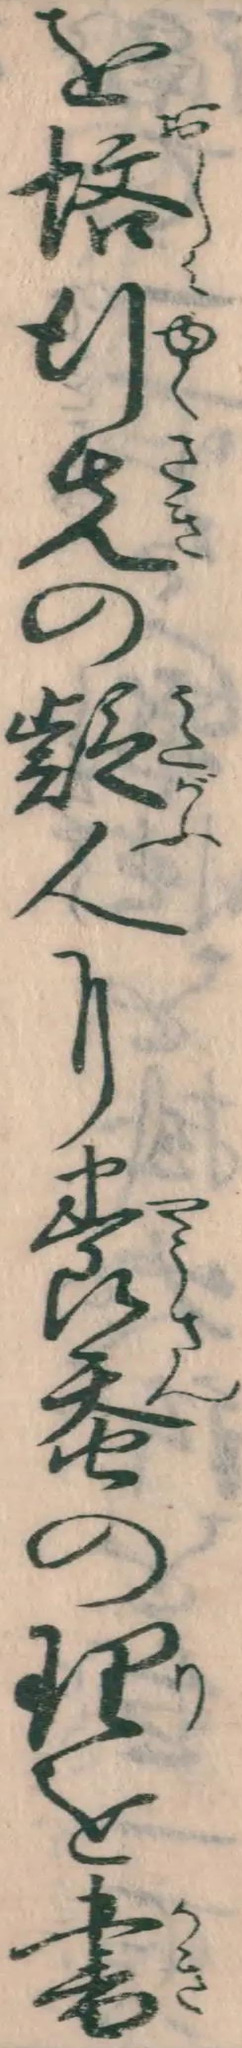を悋行先の疑人に養蚕の理を書
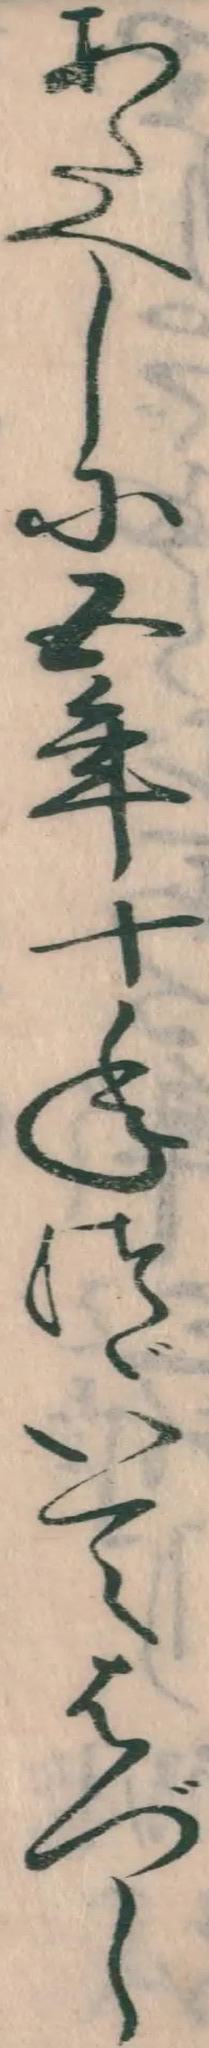あたへしに五年十年つゞいてはづし
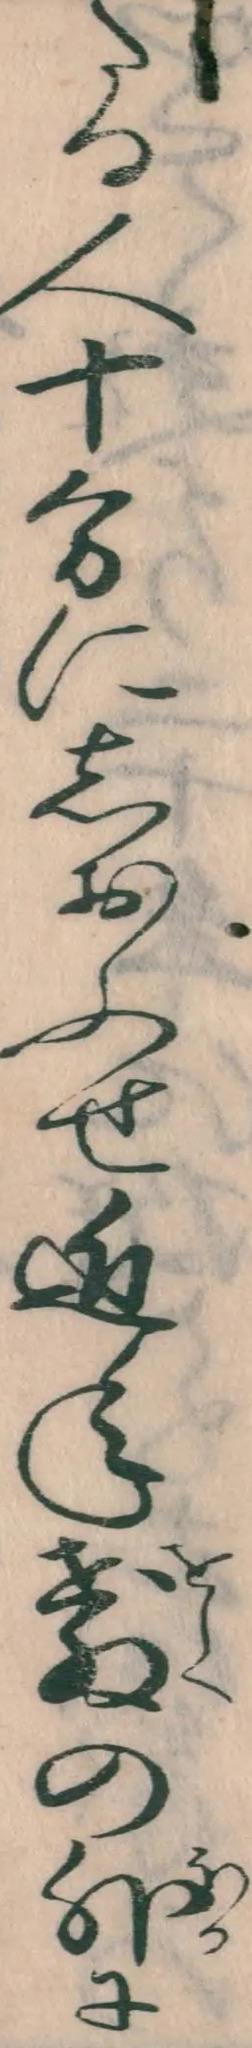たる人十分にしおふせ近年教の外に
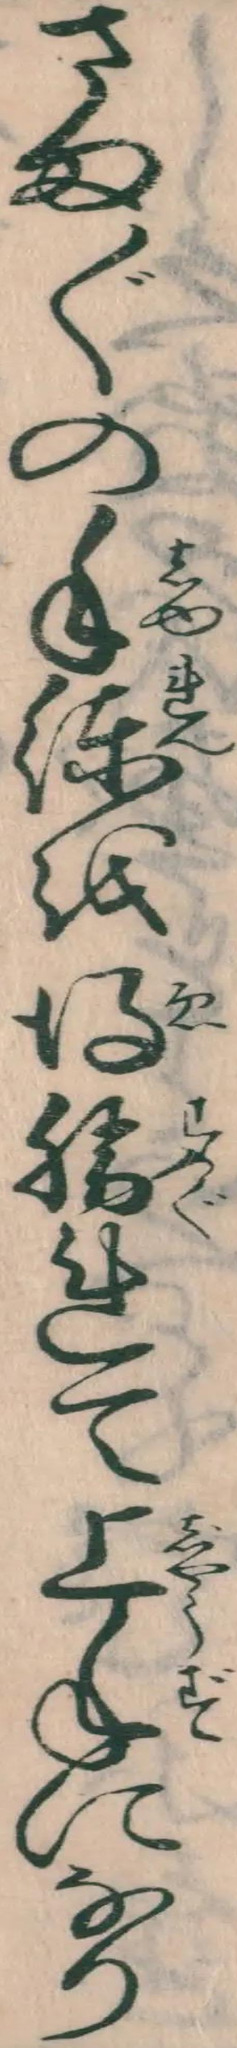さま〴〵の手練を得勝れて上手になり
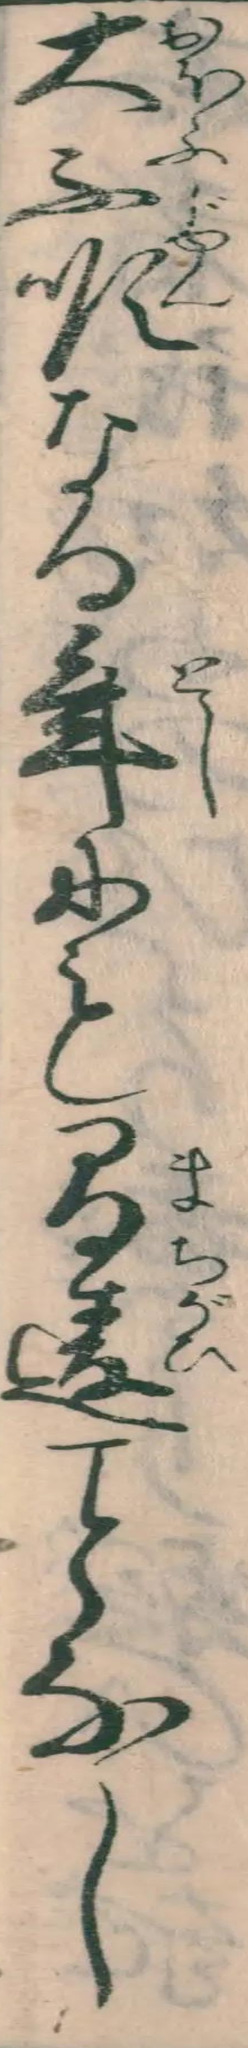大不順なる年にも間違ことなし
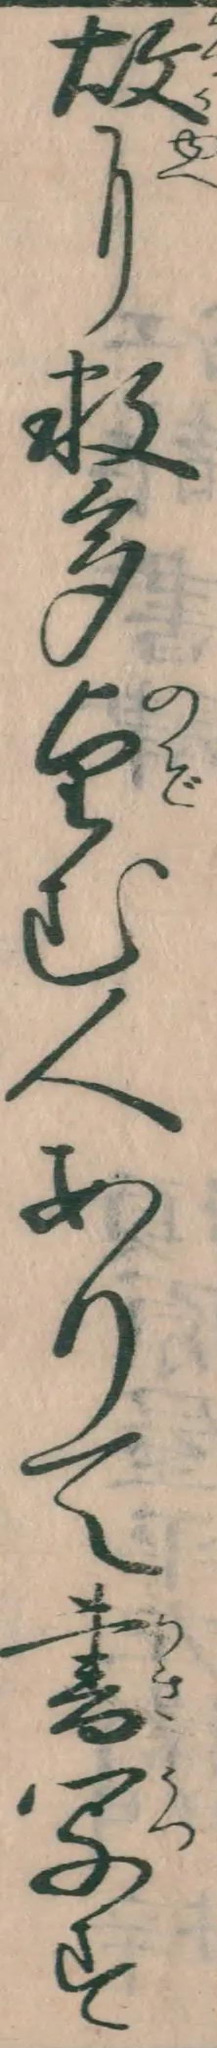故に数多望む人ありて書写す
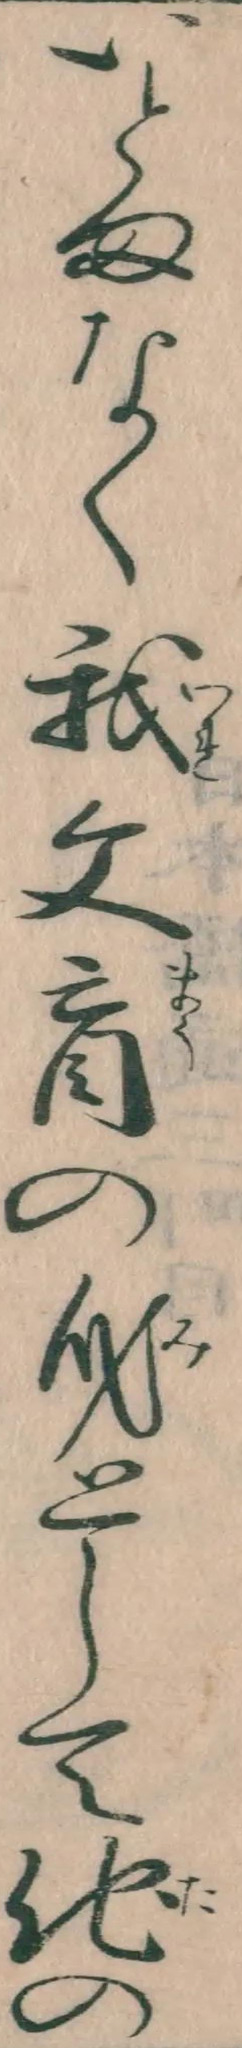いとまなく我文盲の身として他の
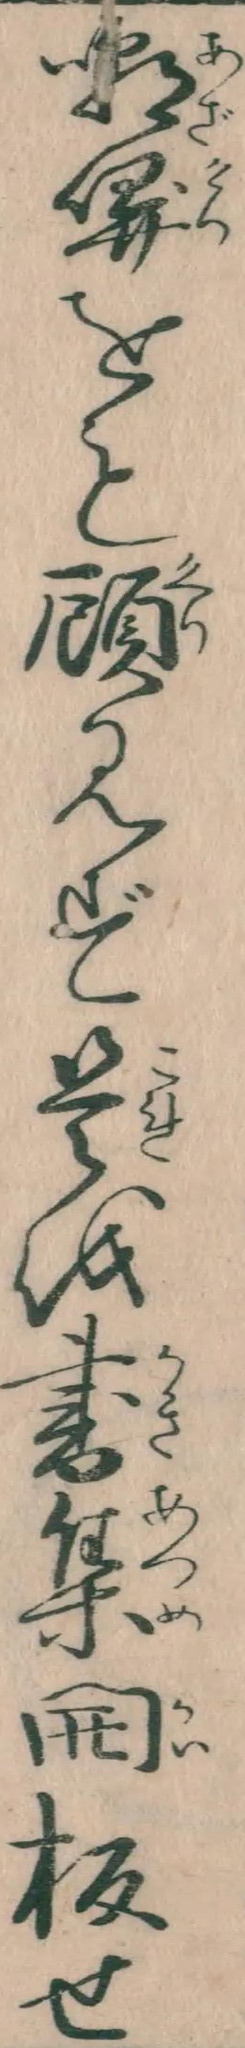嘲哢をも顧見ず是を書集開板せ
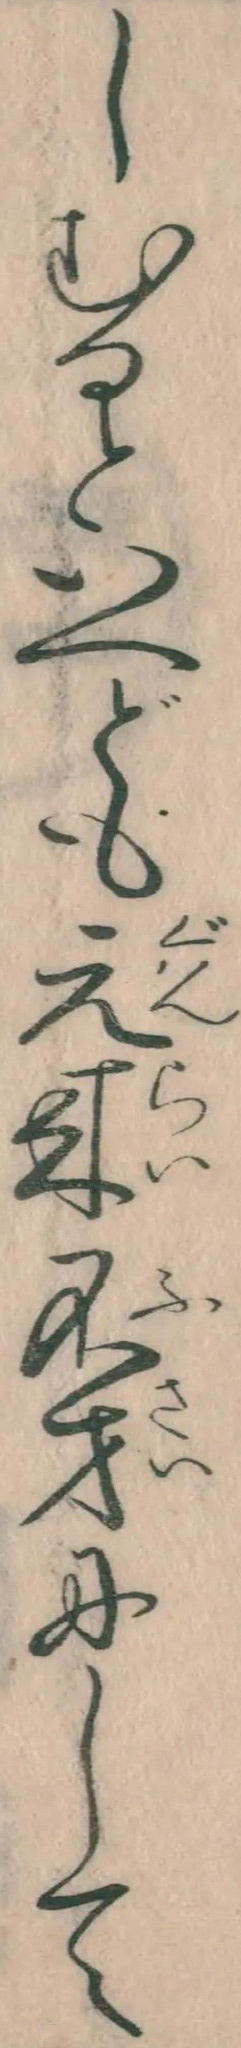しむるといへども元来不才にして
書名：新撰養蚕秘書
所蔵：国立国会図書館 National Diet Library, JAPAN
